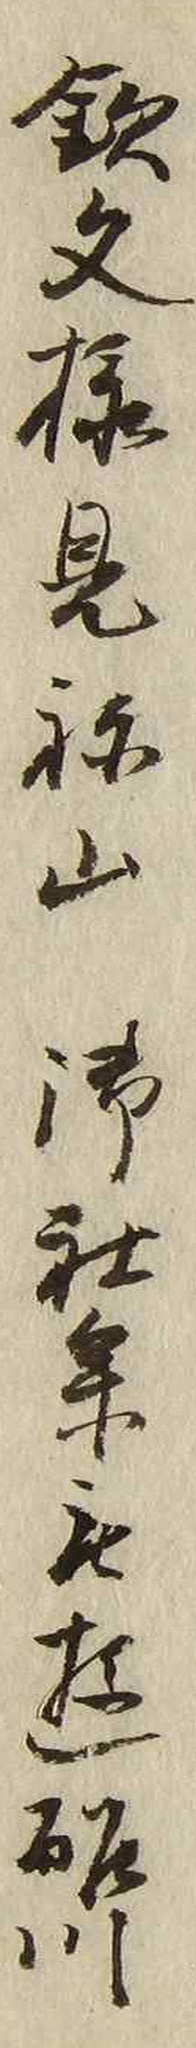欽文様見禰山御社参被遊酢川

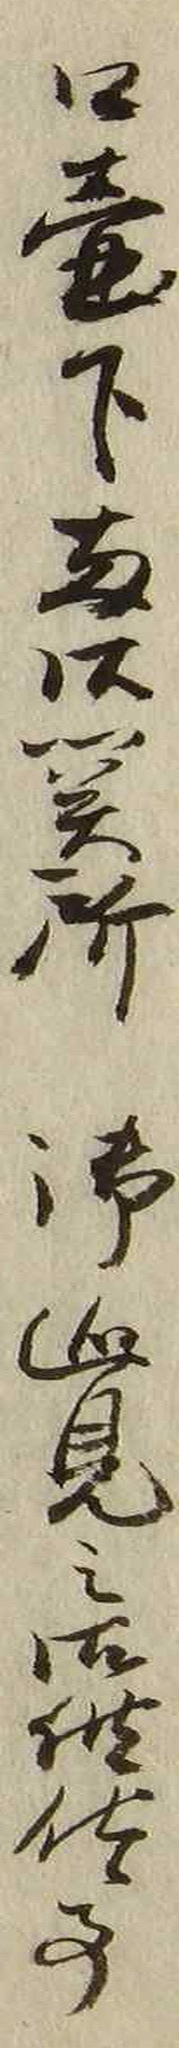口壷下両御関所御巡見之御供仕候事
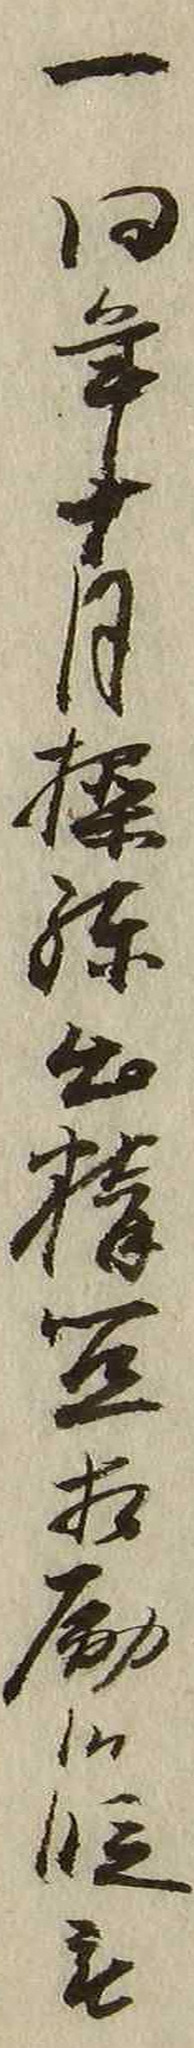一同年十月操練出精宜相励候段被
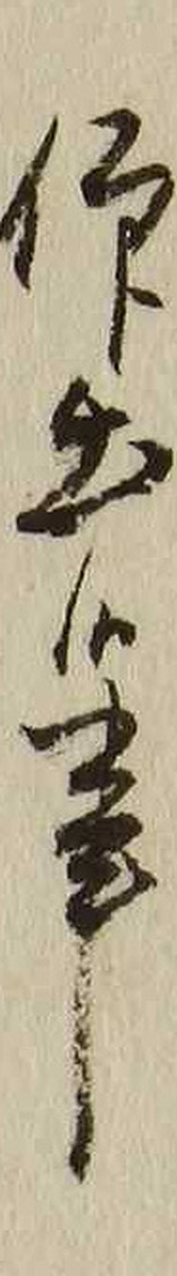仰出候事
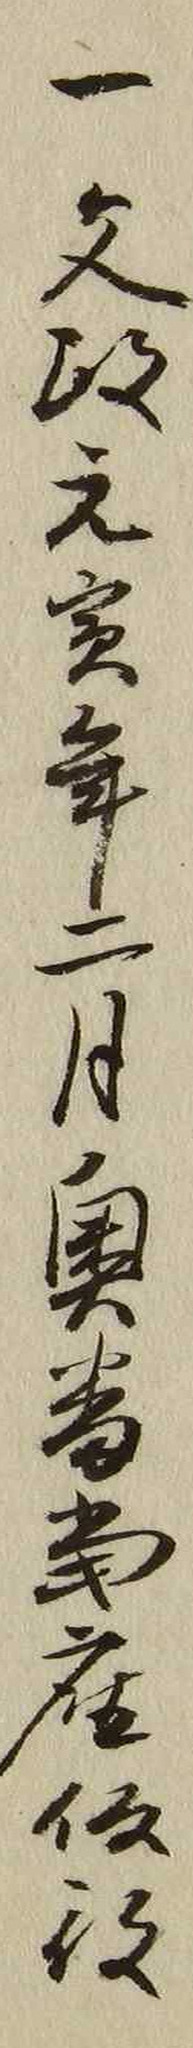一文政元寅年二月奥番当座仮役
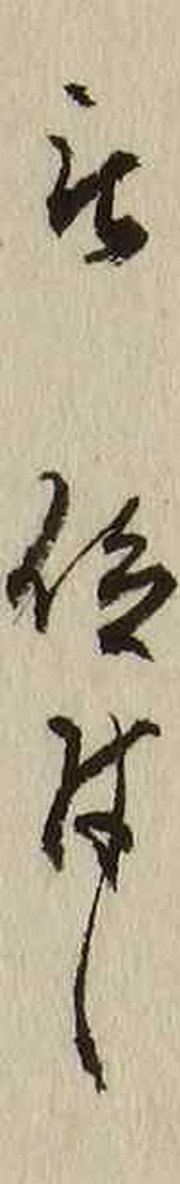被仰付候
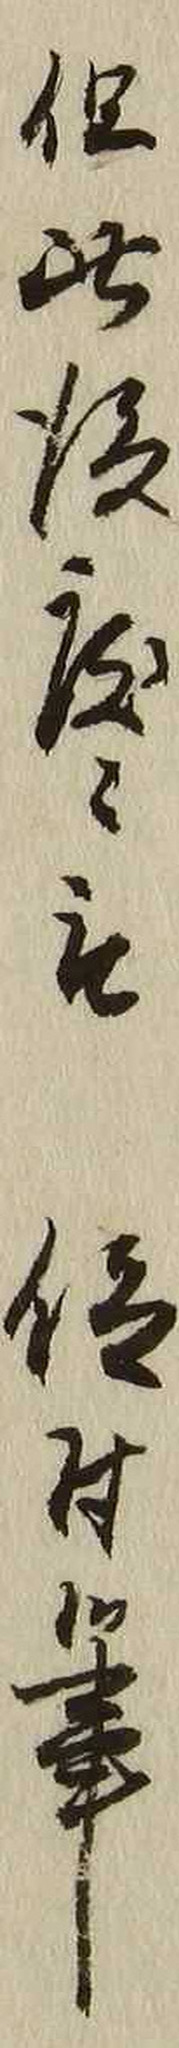但此後度々被仰付候事
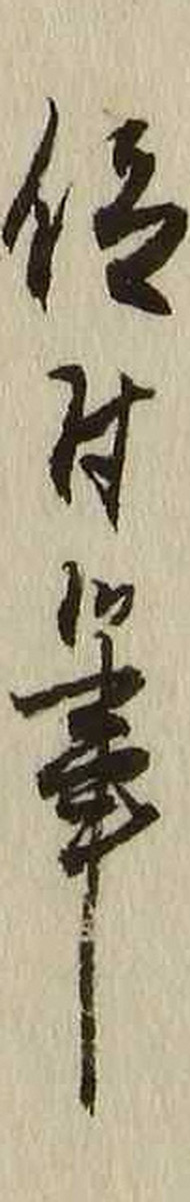仰出候事
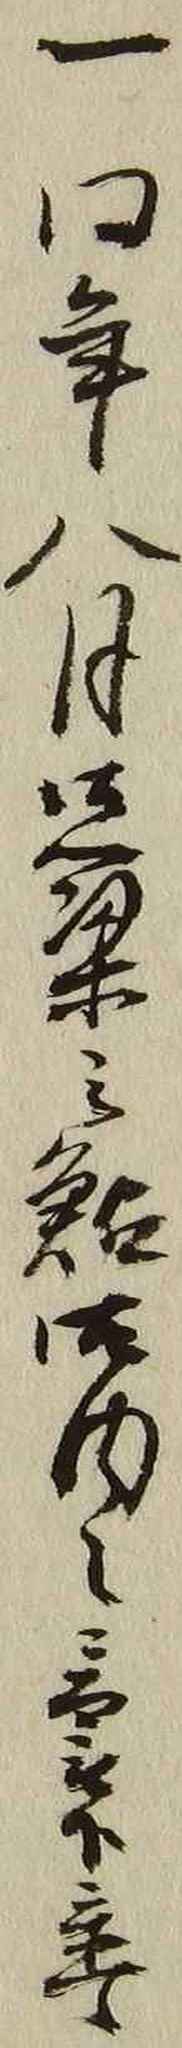一同年八月御簗之鮎御内々ニ而被下置候
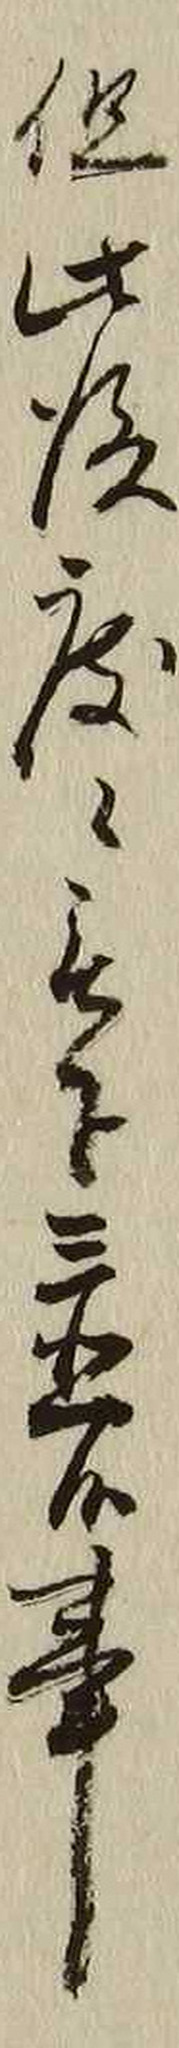但此後度々被下置候事
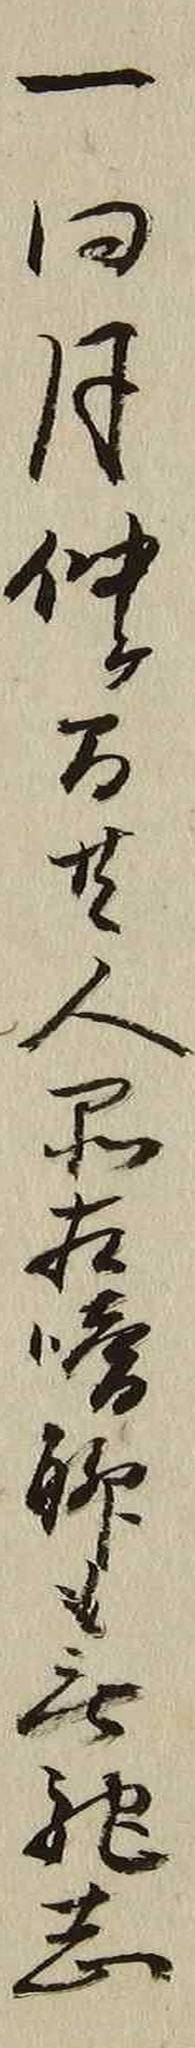一同月仲ケ間共人品相嗜聊も無弛志
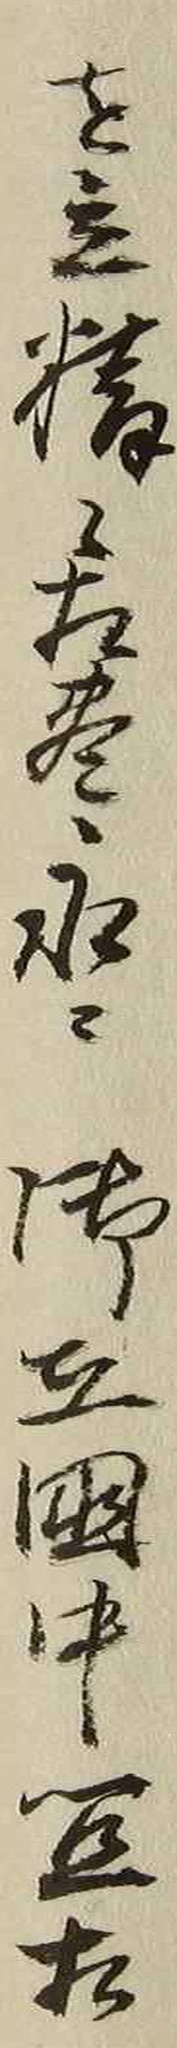を立精々相尽永々御在国中宜相
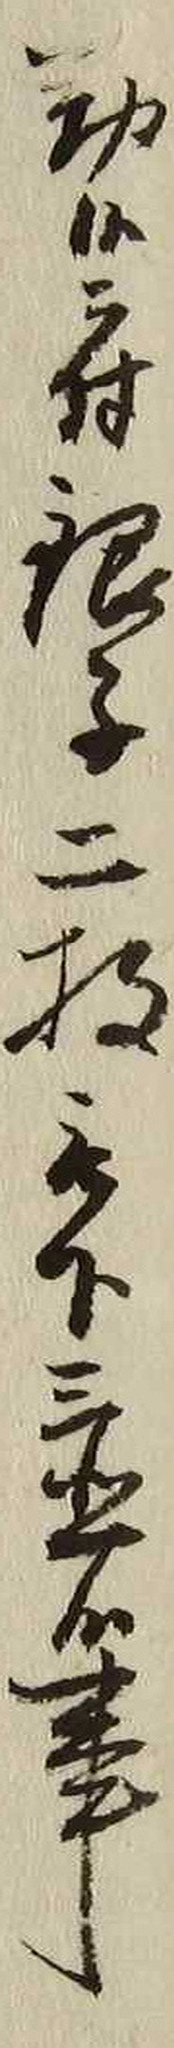勤候ニ付銀子二枚被下置候事
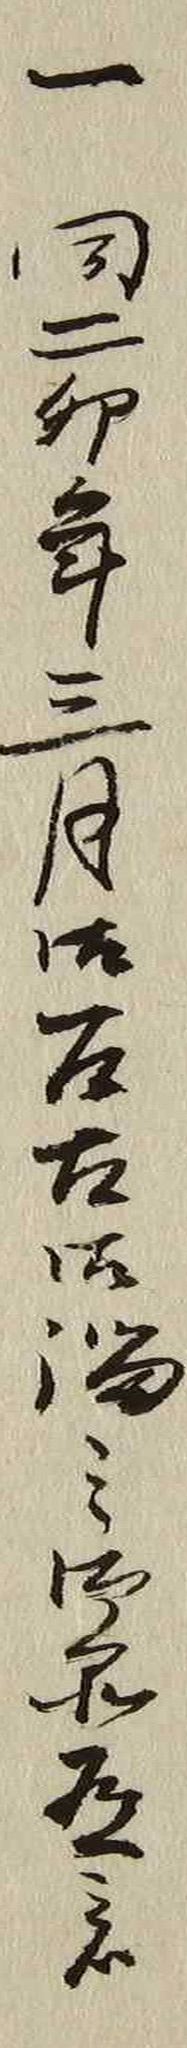一同二卯年三月御召古御溜之御品有之候
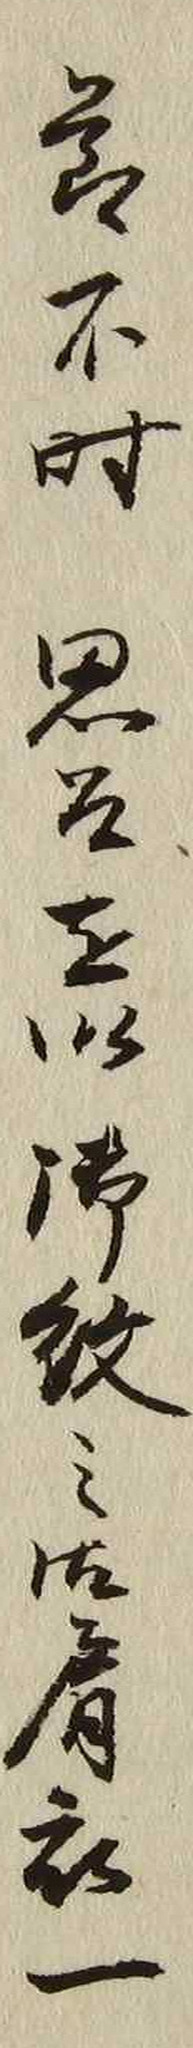節不時思召を以御紋之御肩衣一
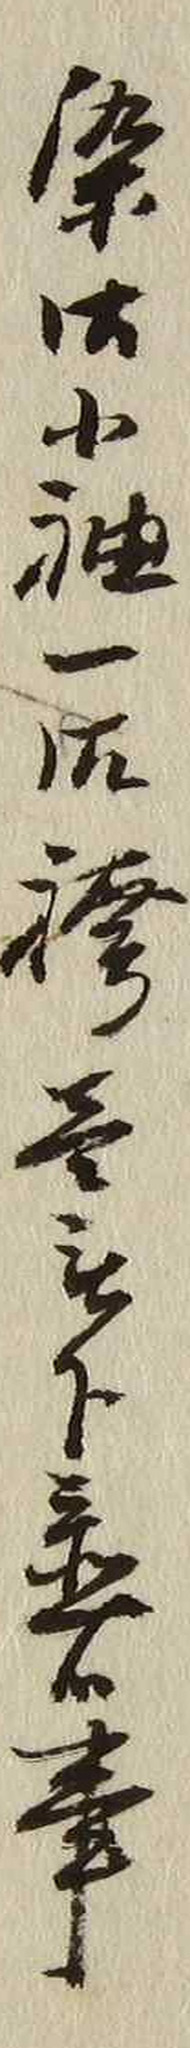染御小袖一御袴壱被下置候事
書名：諸士系譜　巻之345　も之部1
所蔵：会津若松市立会津図書館
